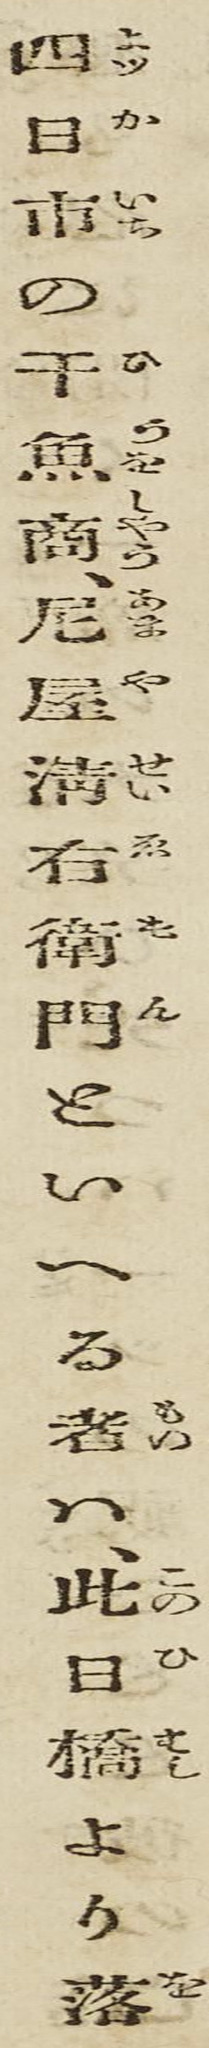四日市の干魚商、尼屋清右衛門といへる者は、此日橋より落
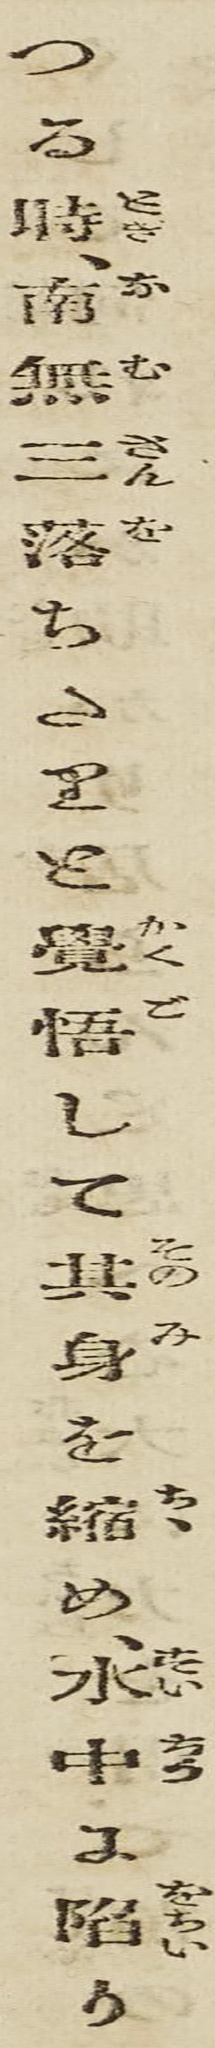つる時、南無三落ちたりと覚悟して其身をち縮め、水中に陥り
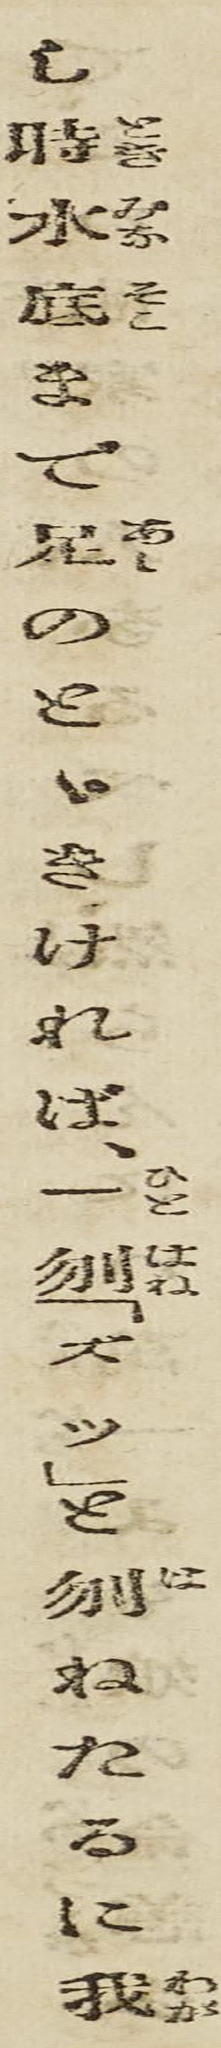し時水底まで足のとゞきければ、一刎「ズツ」と刎ねたるに我
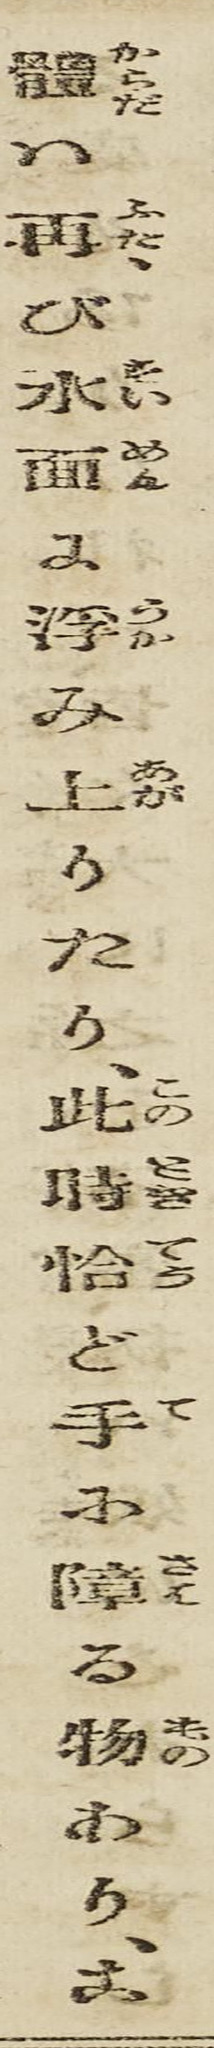体は再び水面に浮み上りたり、此時恰ど手に障る物あり、こ
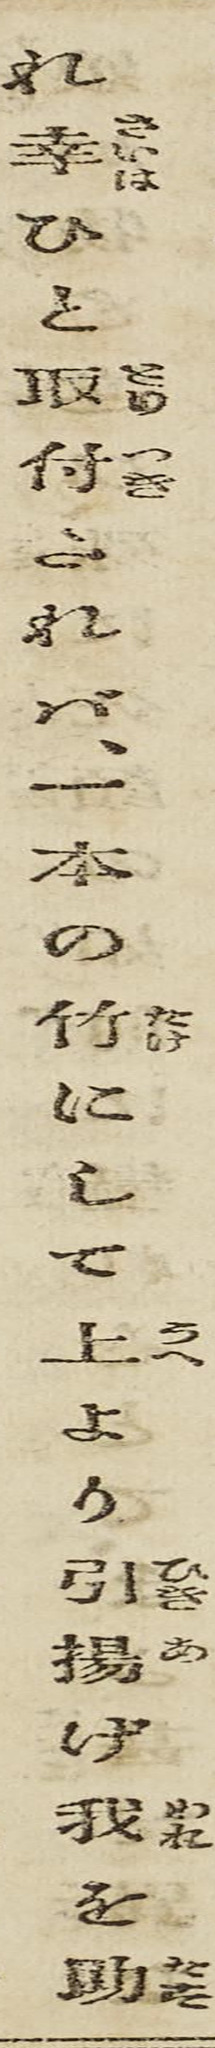れ幸ひと取付たれば、一本の竹にして上より引揚げ我を助
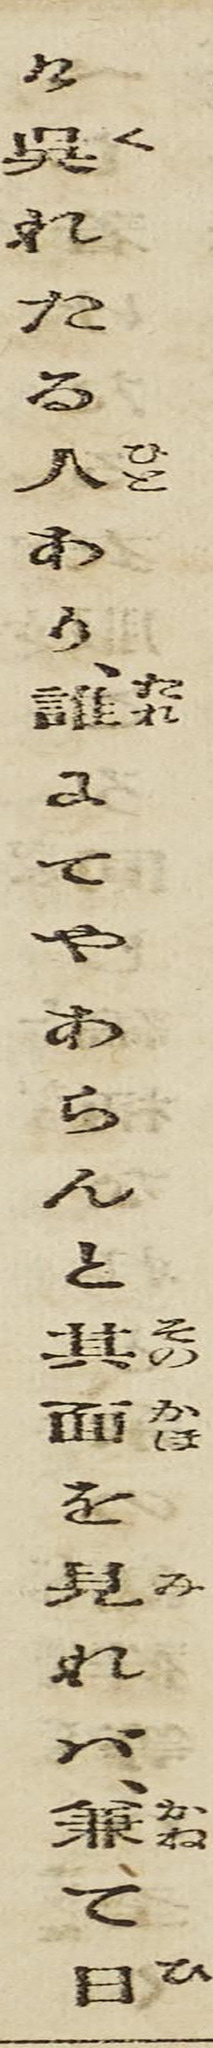け呉たる人あり、誰にてやあらんと其面を見れば、兼て日
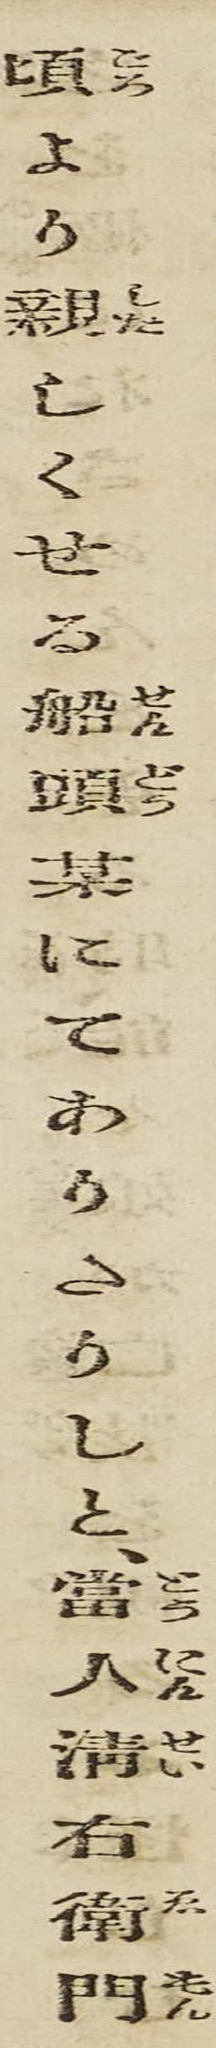頃より親しくせる船頭某にてありたりしと、当人清右衛門
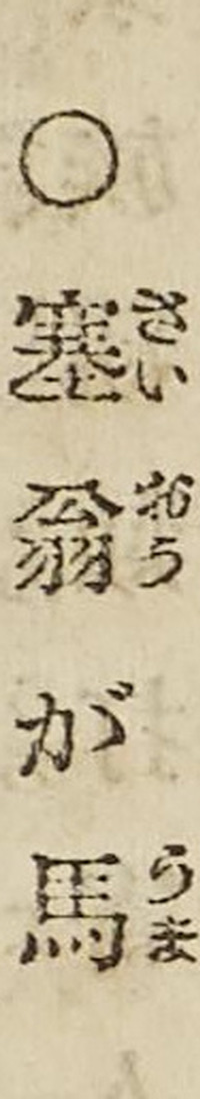○塞翁が馬
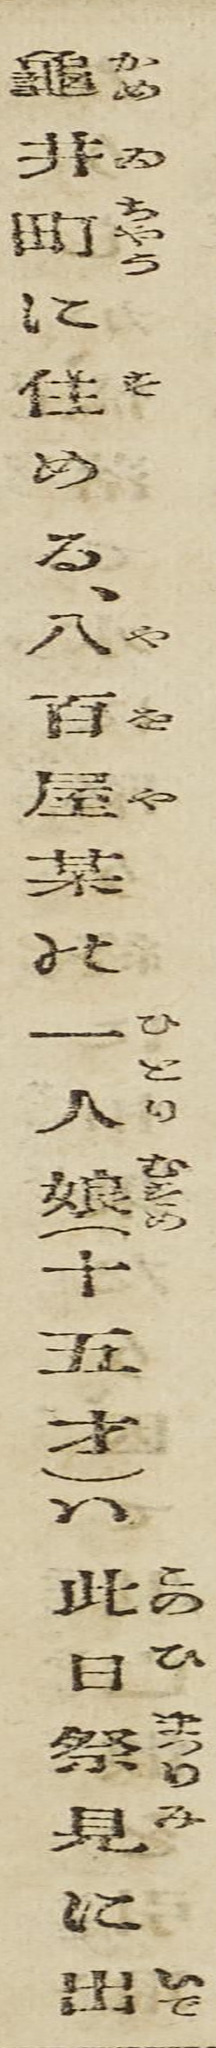亀井町に住める、八百屋某の一人娘は此日祭見に出

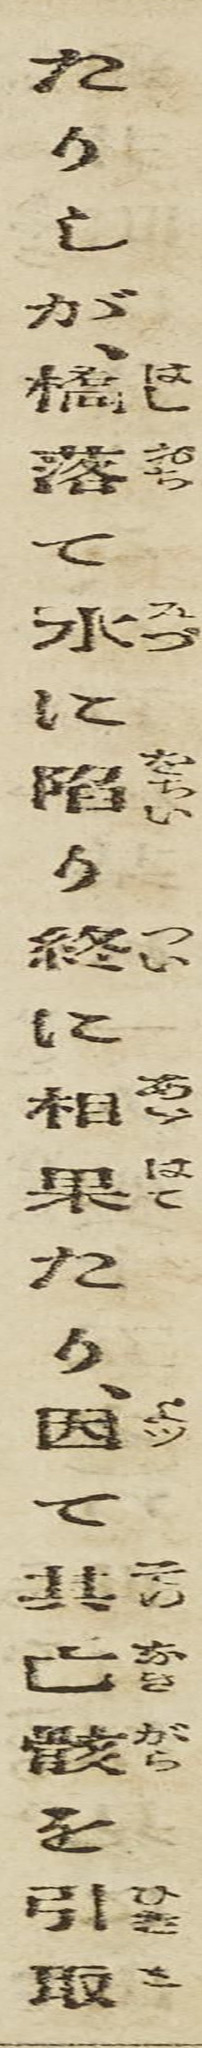たりしが、橋落て水に陥り終に相果たり、因て其亡骸を引取
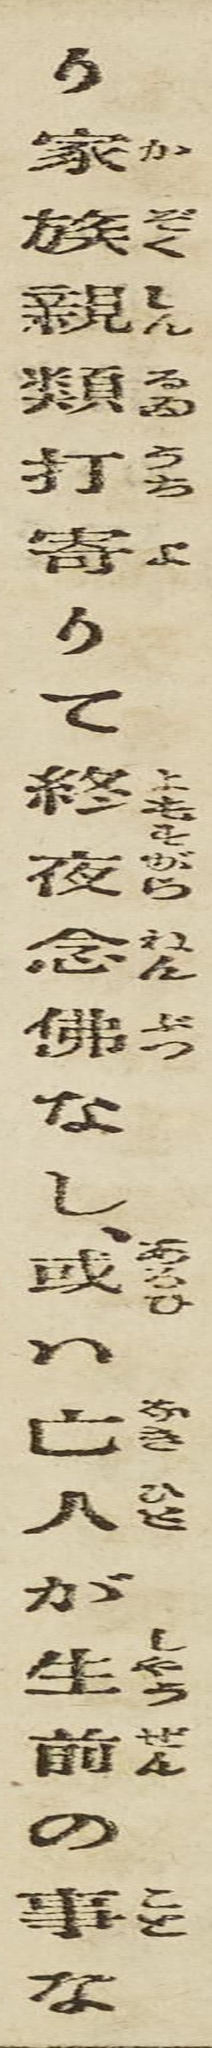り家族親類打寄りて終夜念佛なし、或は亡人が生前の事な
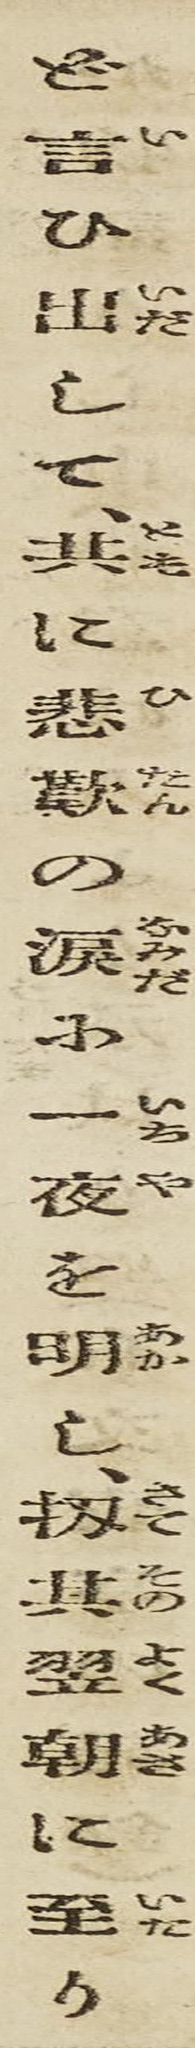ど言ひ出して、共に悲嘆の涙に一夜を明し、扨其翌朝に至り
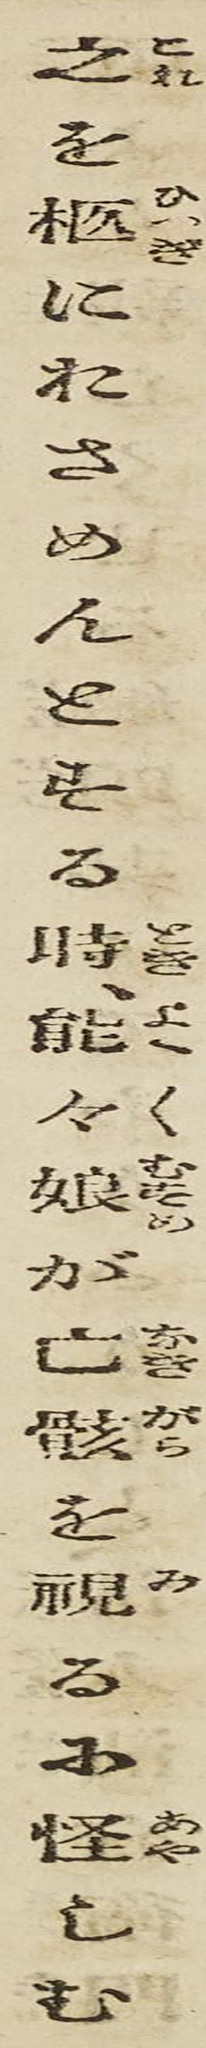之を柩におさめんとする時、能々娘が亡骸を視るに怪しむ
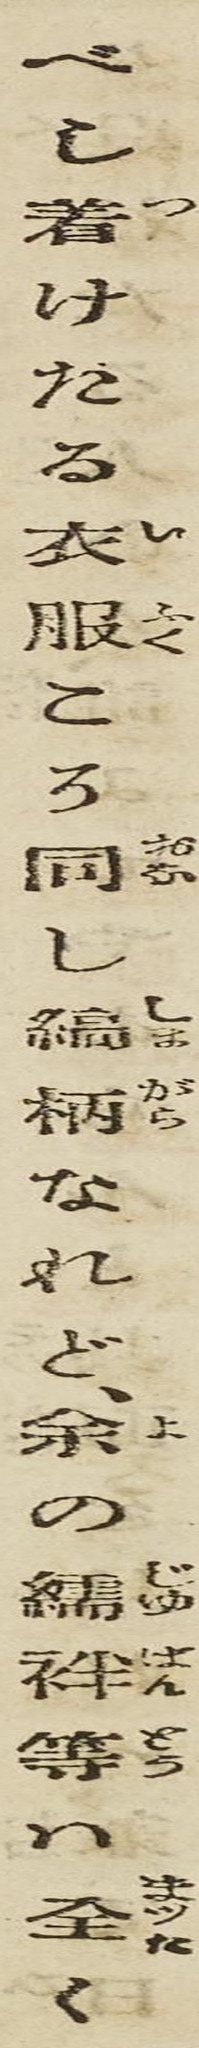べし着けたる衣服こそ同し縞柄なれど、余の襦袢等は全く
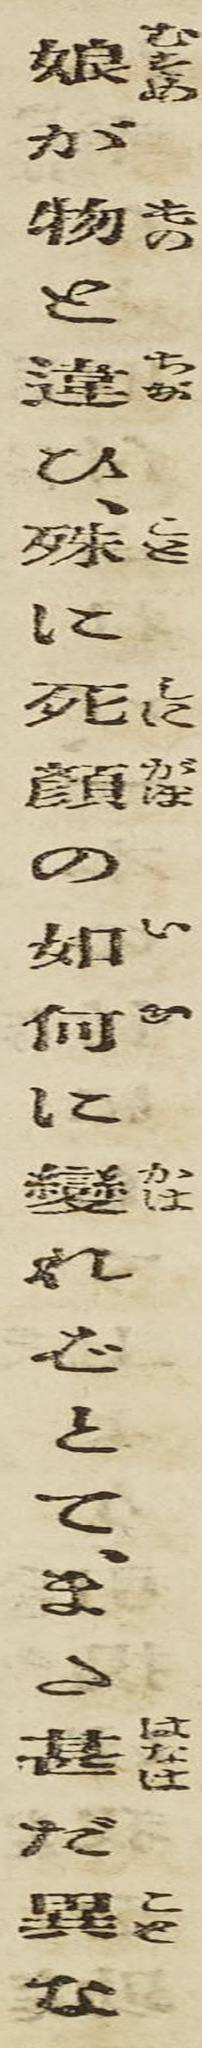娘が物と違ひ、殊に死顔の如何に変ればとて、また甚だ異な
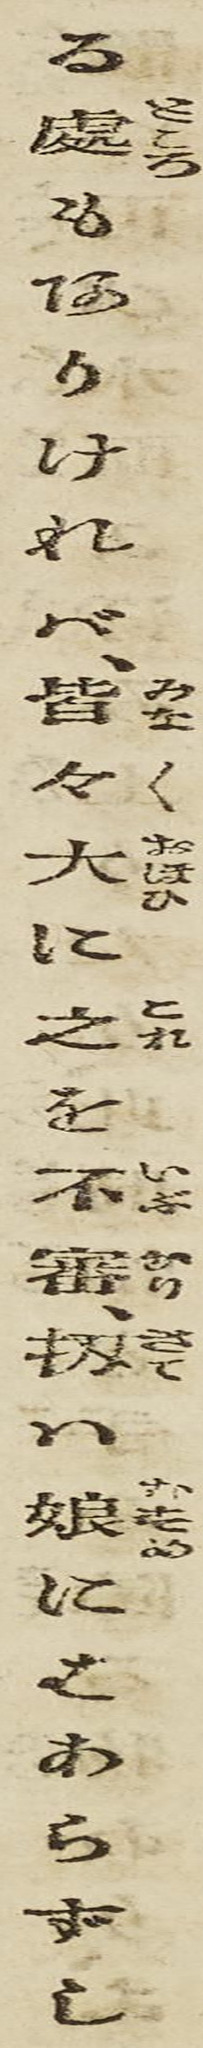る処もありければ、皆々大に之を不審、扨は娘にはあらずし
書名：永代惨話　文化の夢　全
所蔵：東京大学地震研究所図書室 Earthquake Research Institute Library, The University of Tokyo, JAPAN
